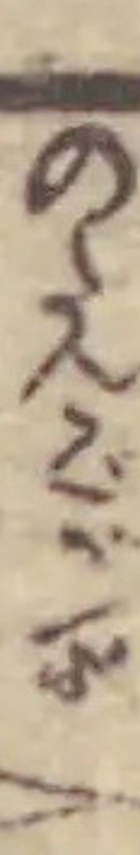のたんごが所
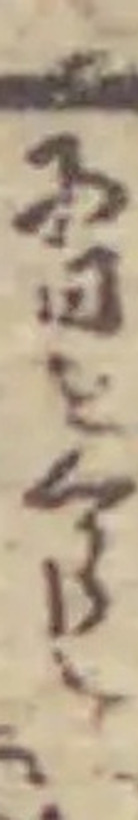に日をくらし
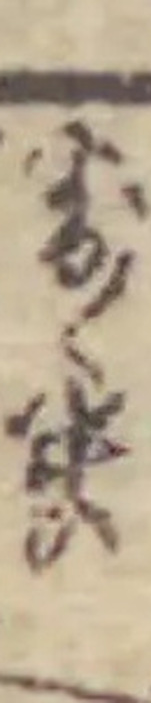よな〳〵中の
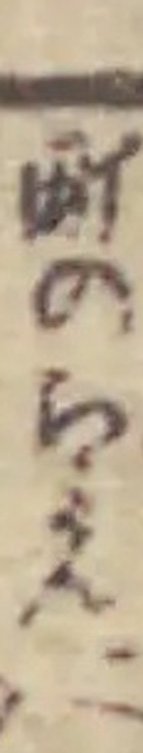町のちよん
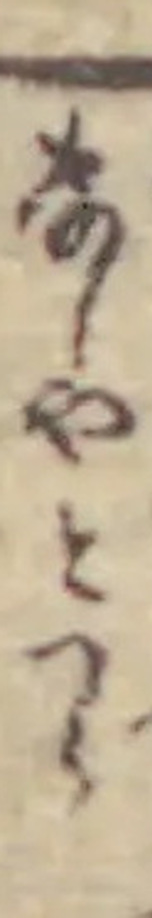なしやとつら
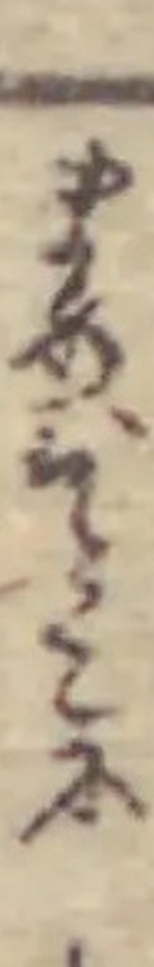まめおとこに
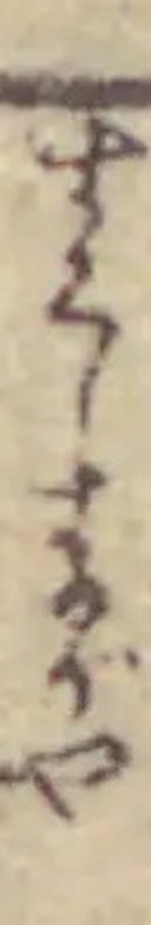すこしするがや
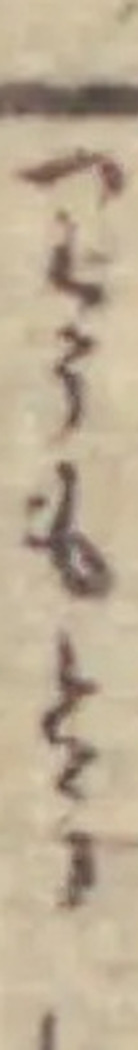りうもとう
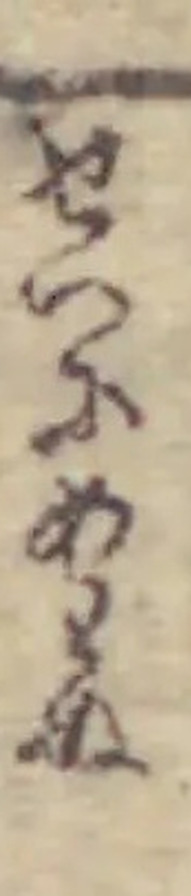せいにあわぬ
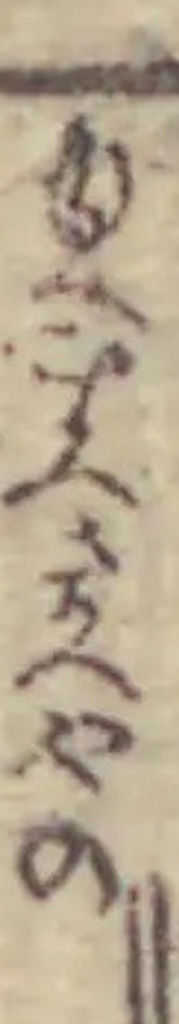ゆへまへさかへやの
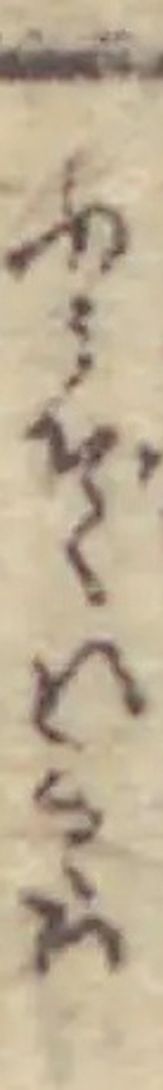ふうぞくはこゝろ
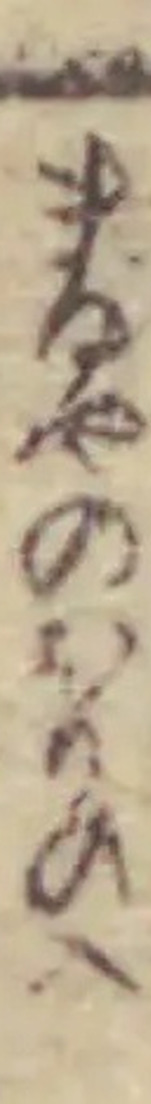まるやのおもひ入
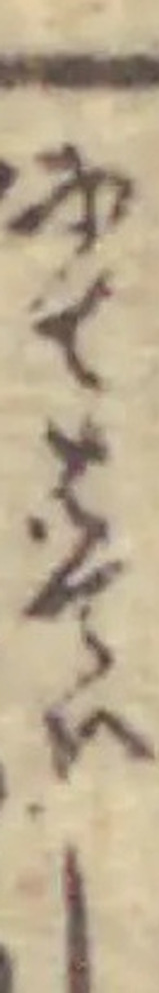にてはては
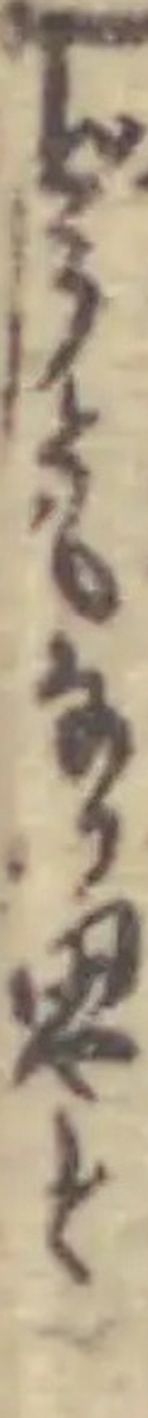どうともなり田やと
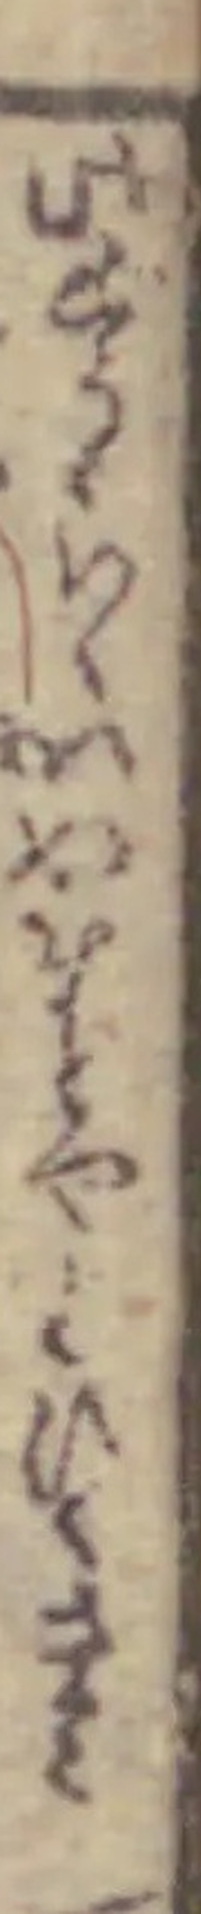此とうらくはやまとやとひくさみ
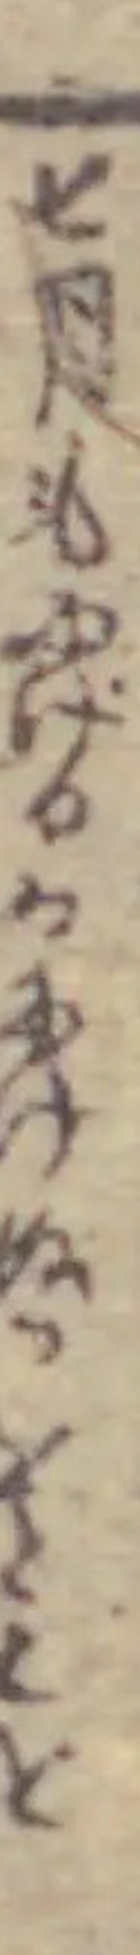七月もにげるかにけぬかをとこを
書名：夜野中狐物 2巻
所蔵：国立国会図書館 National Diet Library, JAPAN
